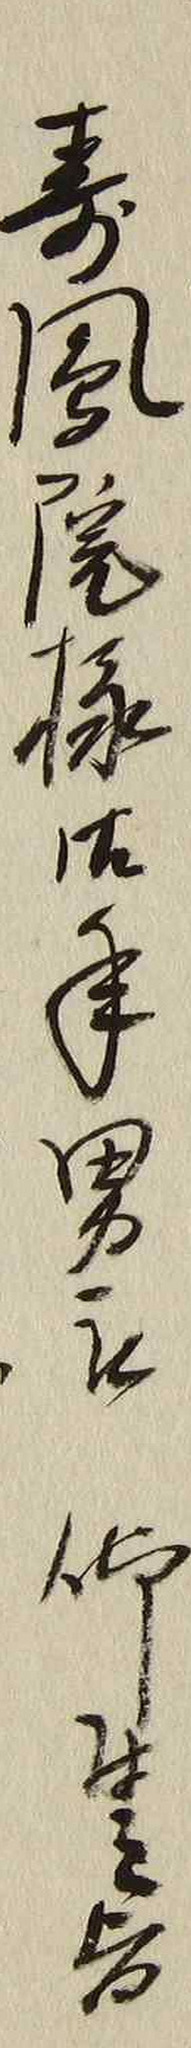寿風院様御年男被仰付之旨
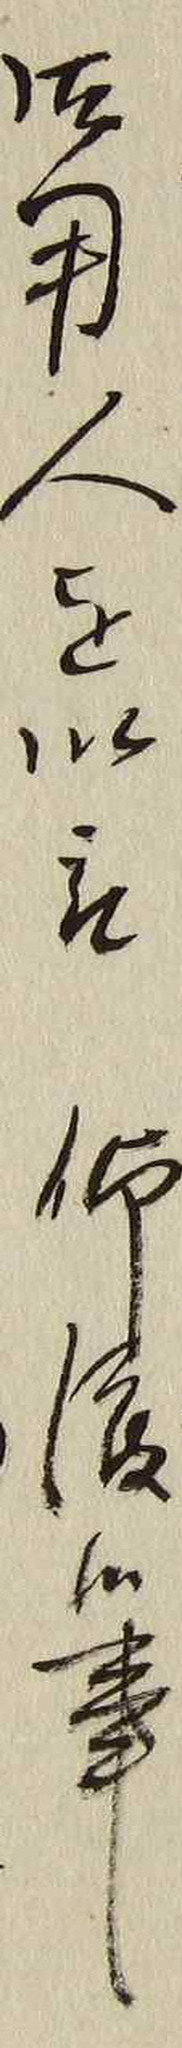御用人を以被仰渡候事
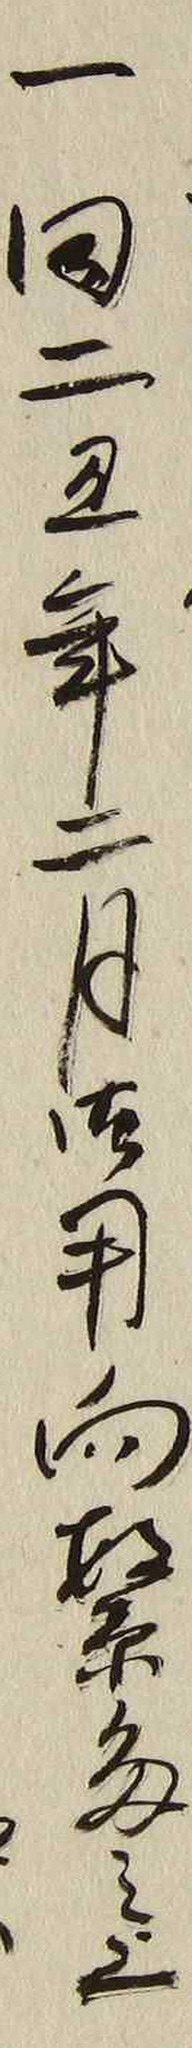一同二丑年二月御用向繋多之上
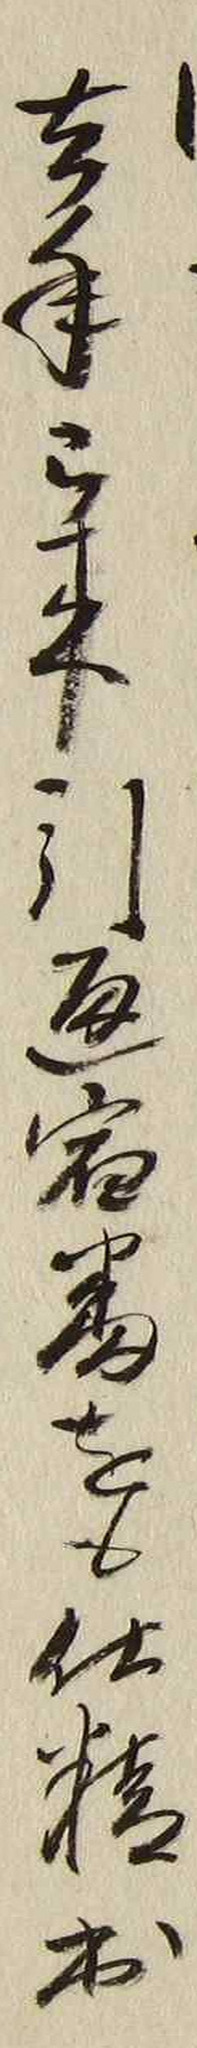去年已来引通宿番をも仕精出
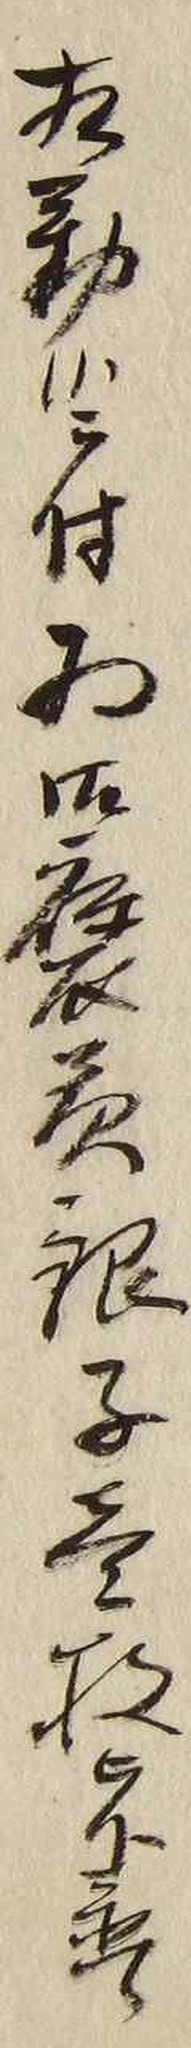相勤候ニ付為御褒美銀子壱枚被下置候

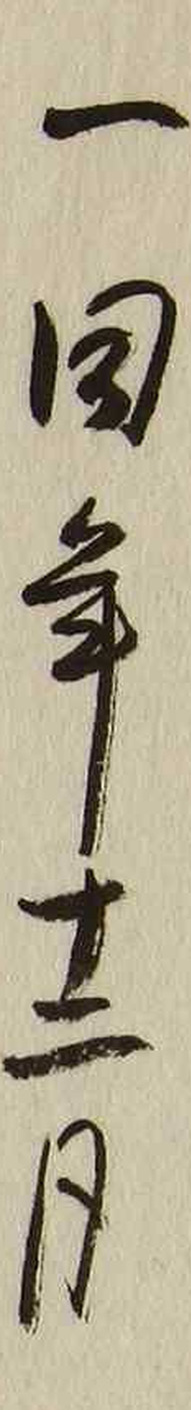一同年十二月
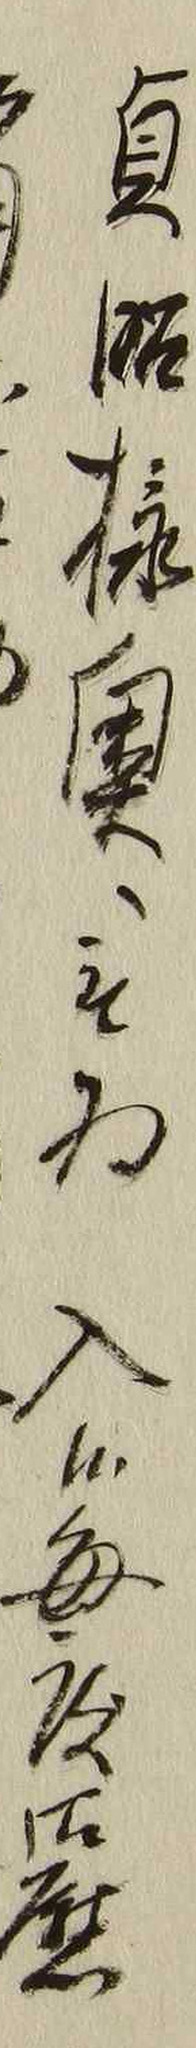貞昭様奥へ被為入候毎度御慰
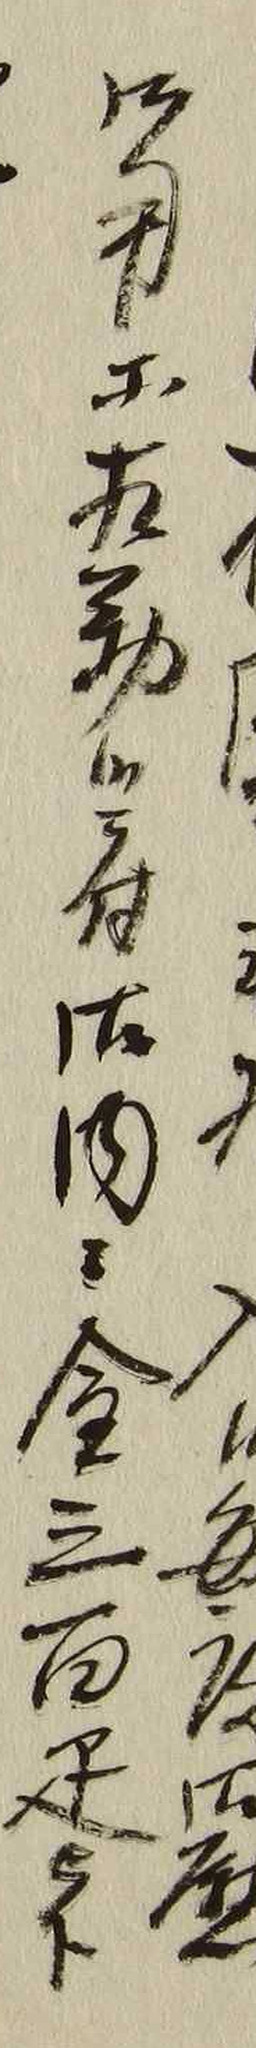御用等相勤候ニ付御内々金三百疋被下
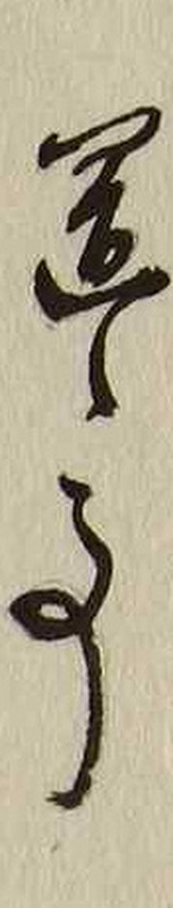置候事
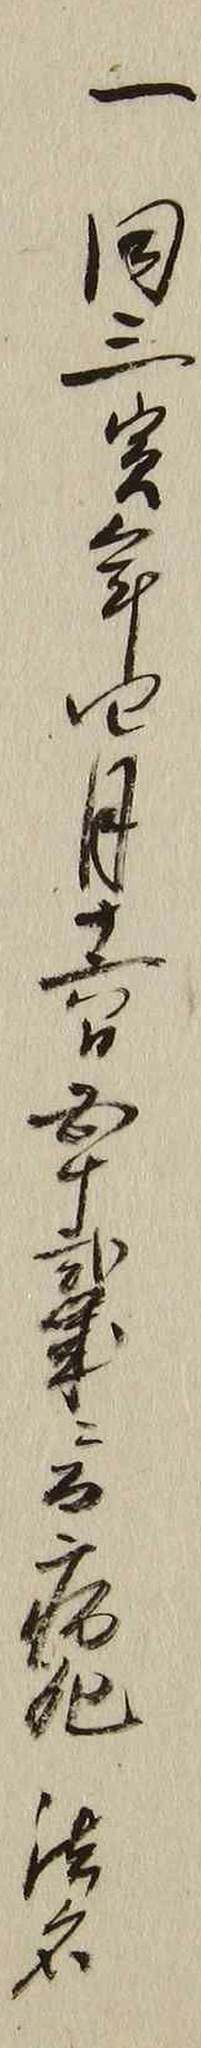一同三寅年四月十六日五十弐歳ニ而病死法名
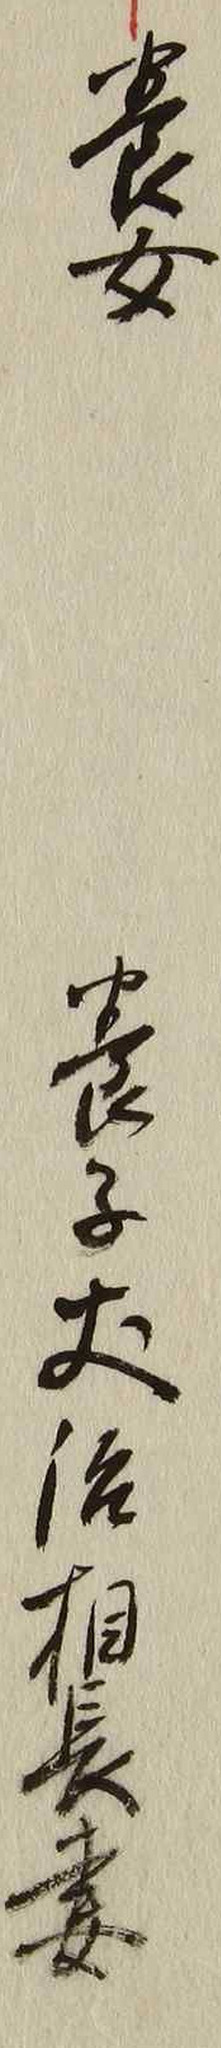養女養父丈治相長妻
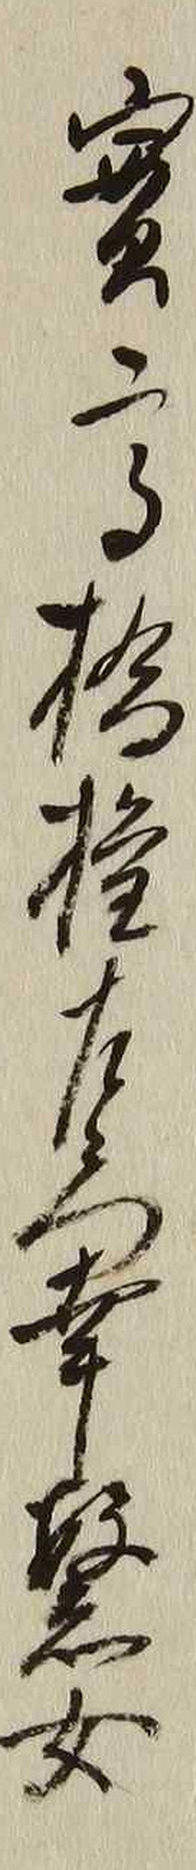実高橋権左衛門幸繁女
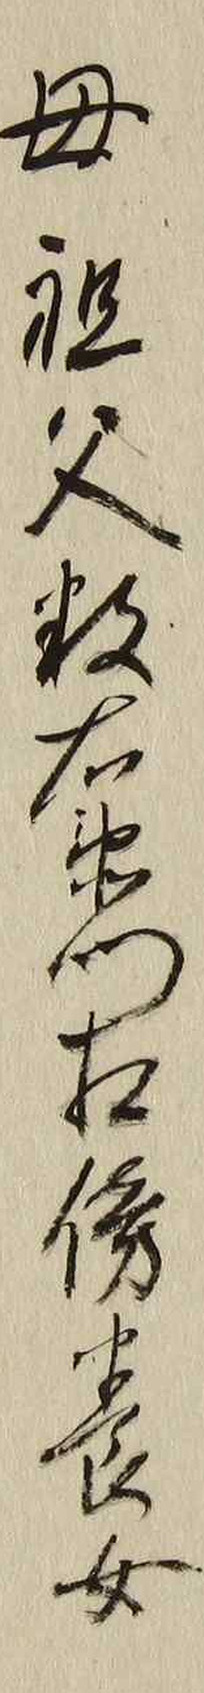母祖父数右衛門相傍養女
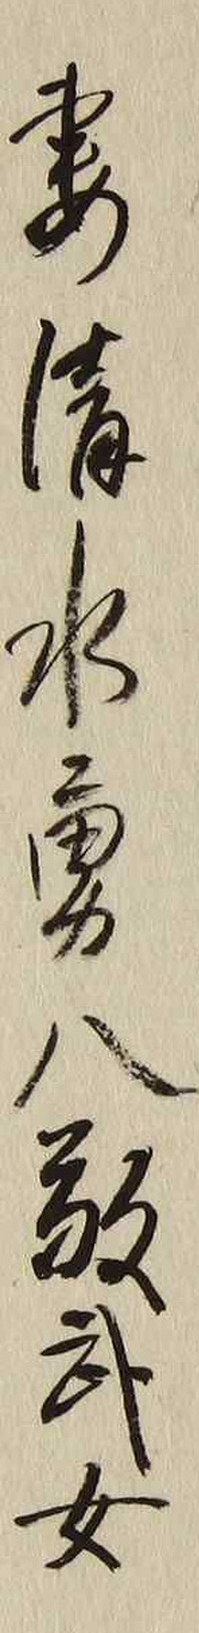妻清水勇八敬武女
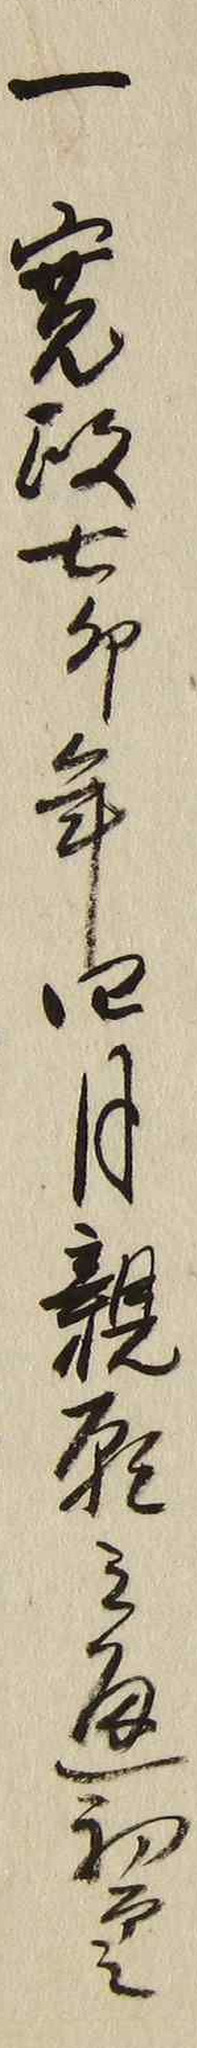一寛政七卯年四月親願之通初而之
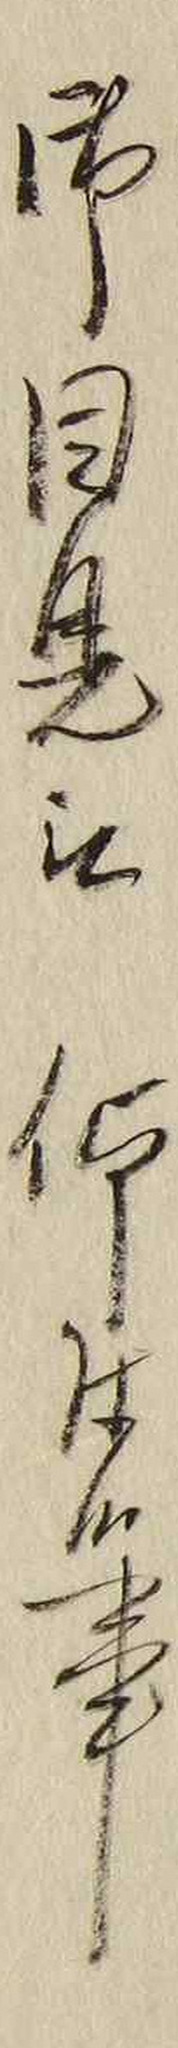御目見被仰付候事
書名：諸士系譜　巻之349　も之部5
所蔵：会津若松市立会津図書館
